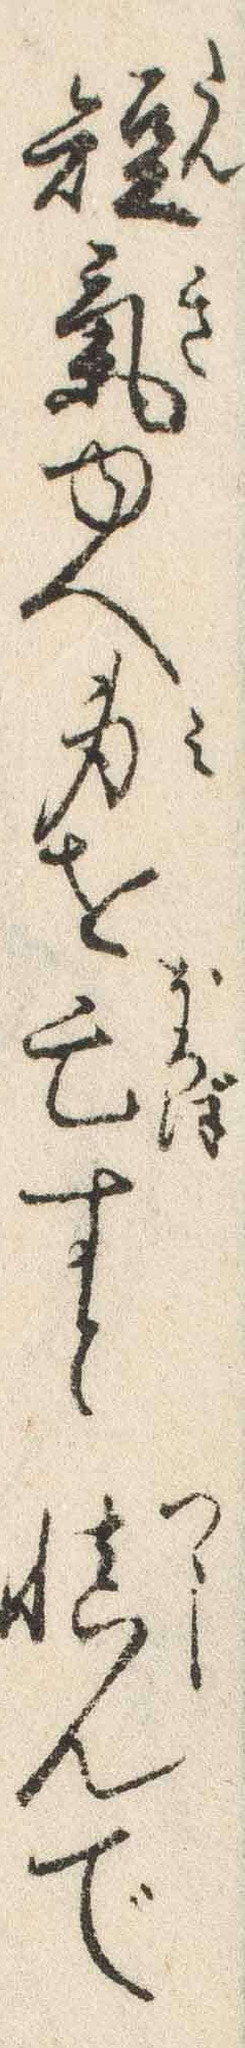短気ゆへ身を亡すと謹んで
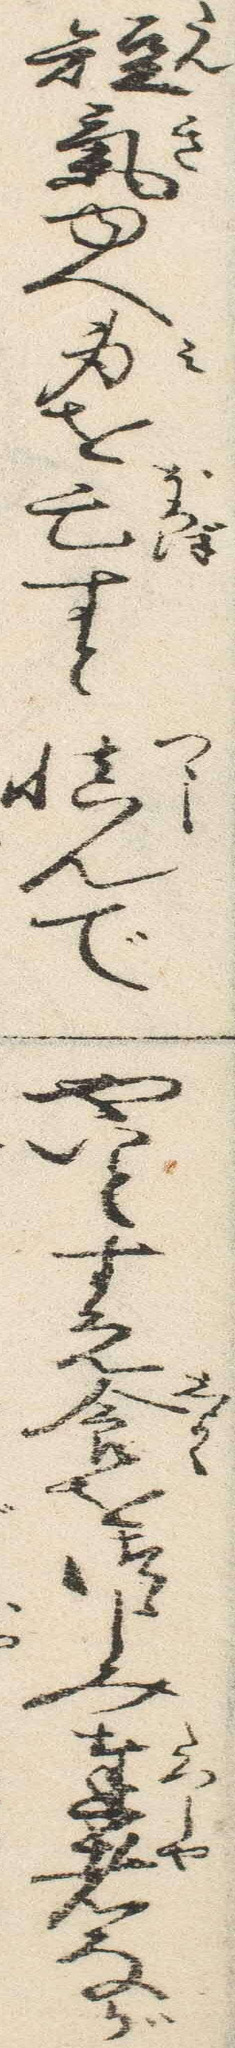短気ゆへ身を亡すと謹んで
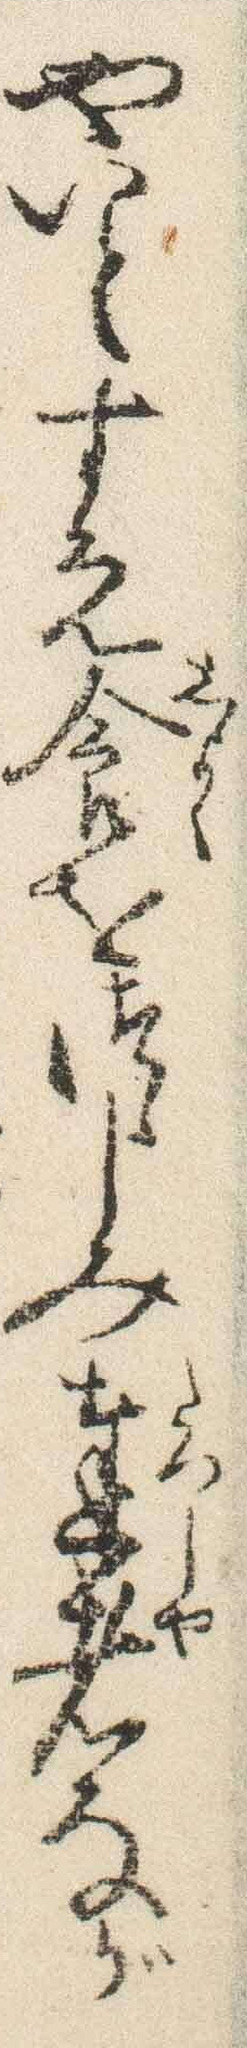やいとすえ食をつゝしみ達者なが
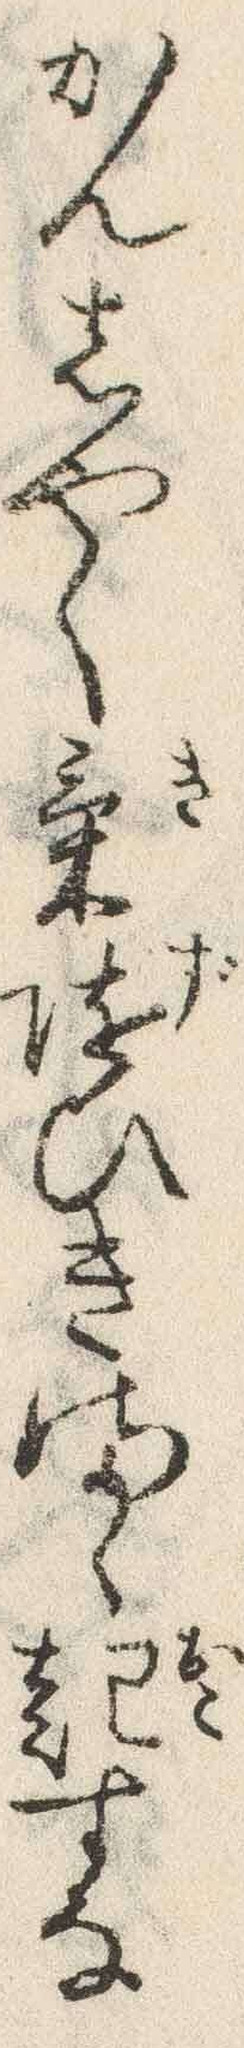かんしやく気随ひきまゝ起すな
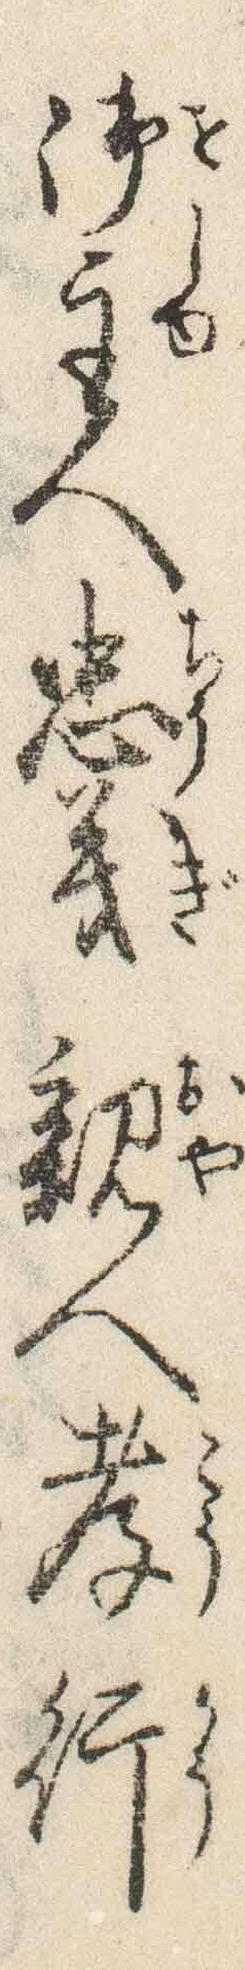御主へ忠義親へ孝行
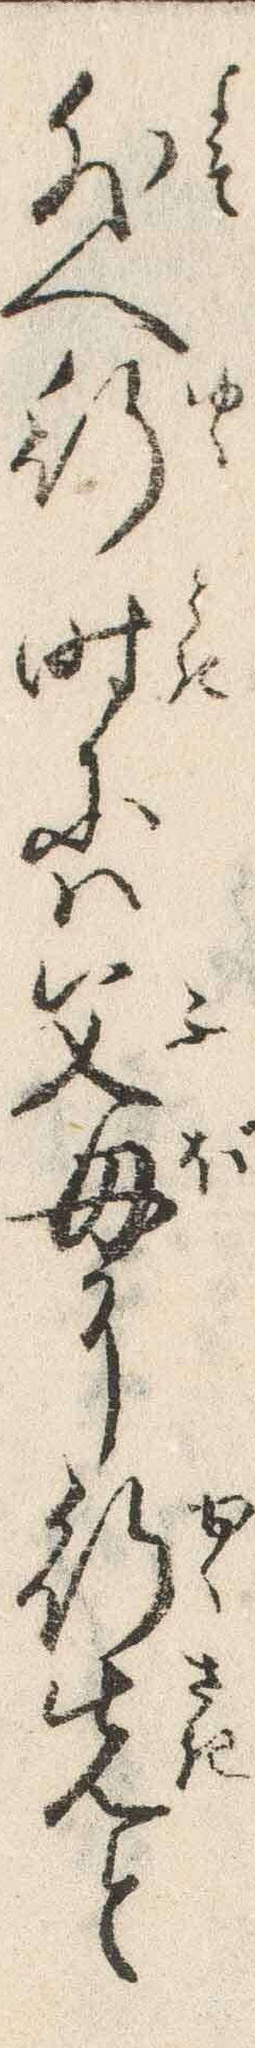外へ行時には父母に行先と
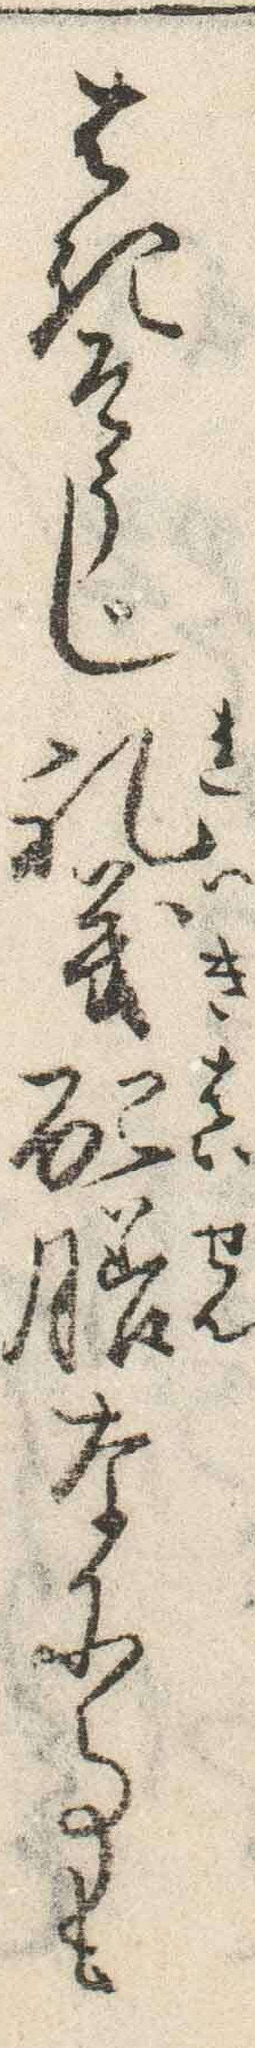はきそうじ礼義配膳なに事も
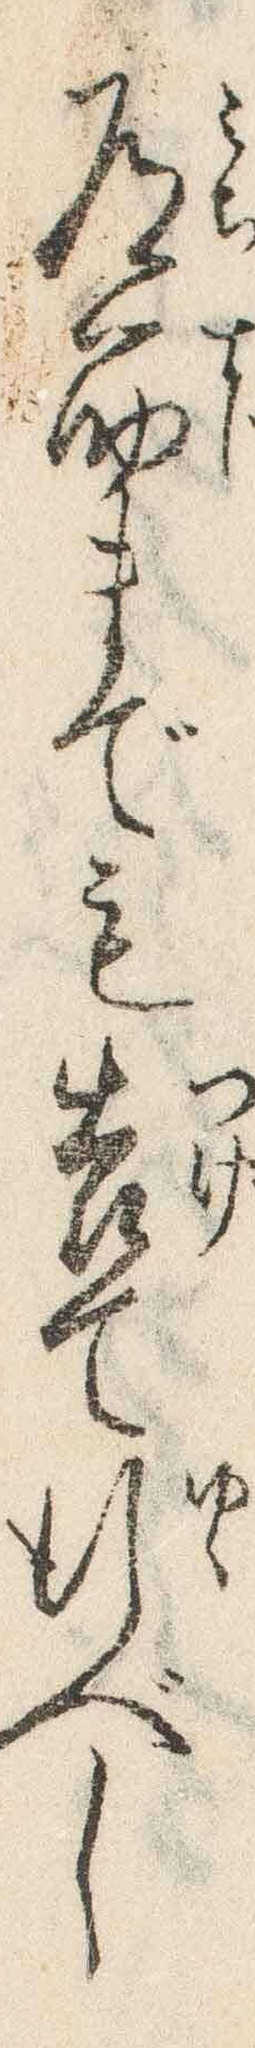道筋までも告て行べし
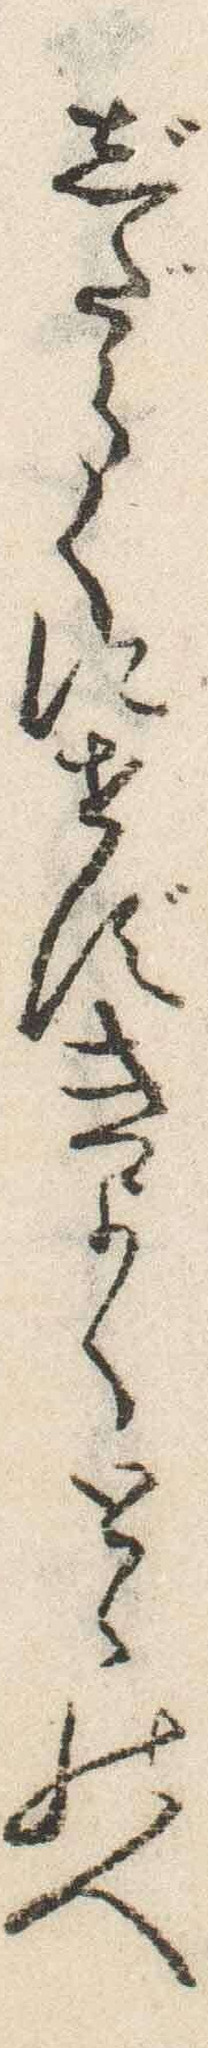じだらくにせずきよくとゝのへ
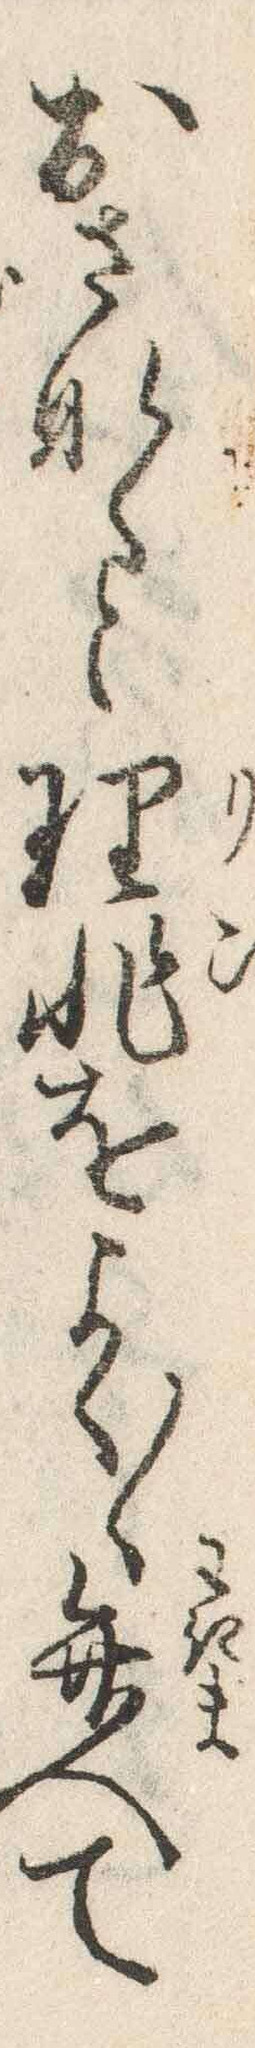おさなくと理非をよく〳〵弁へて
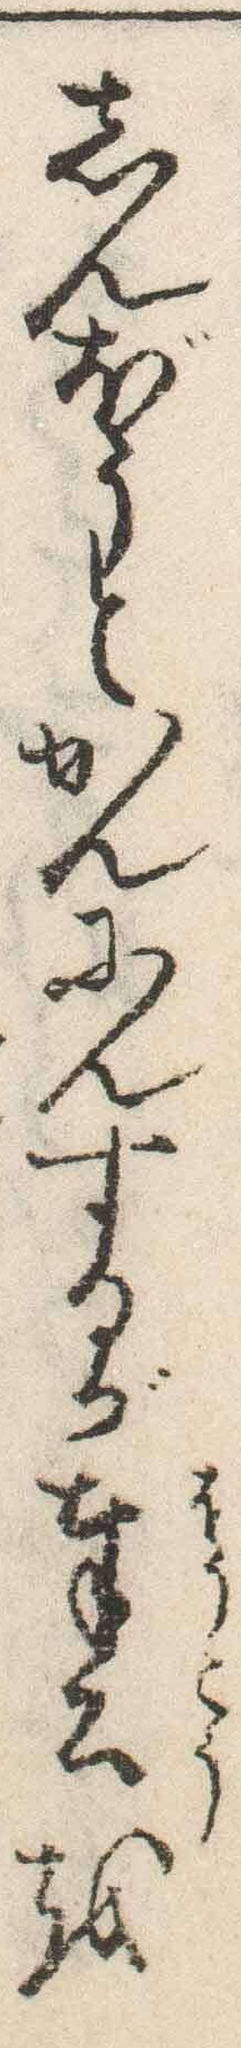しんぼうとかんにんするが奉公を
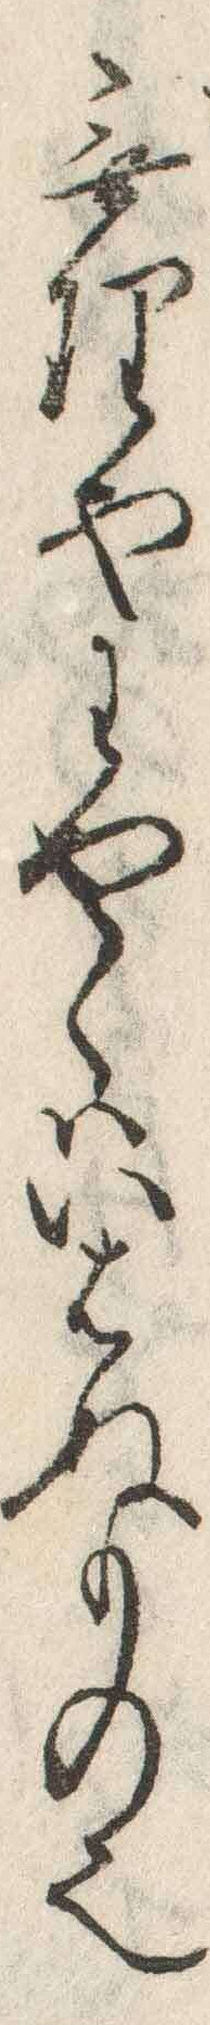無理やわやくはいはぬもの也
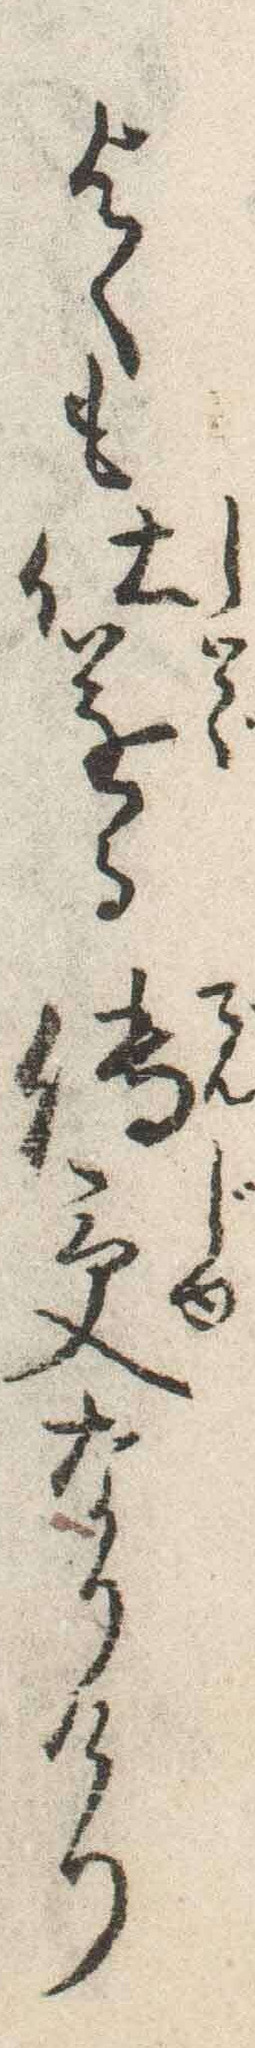よくも仕遂る伝受なりけり
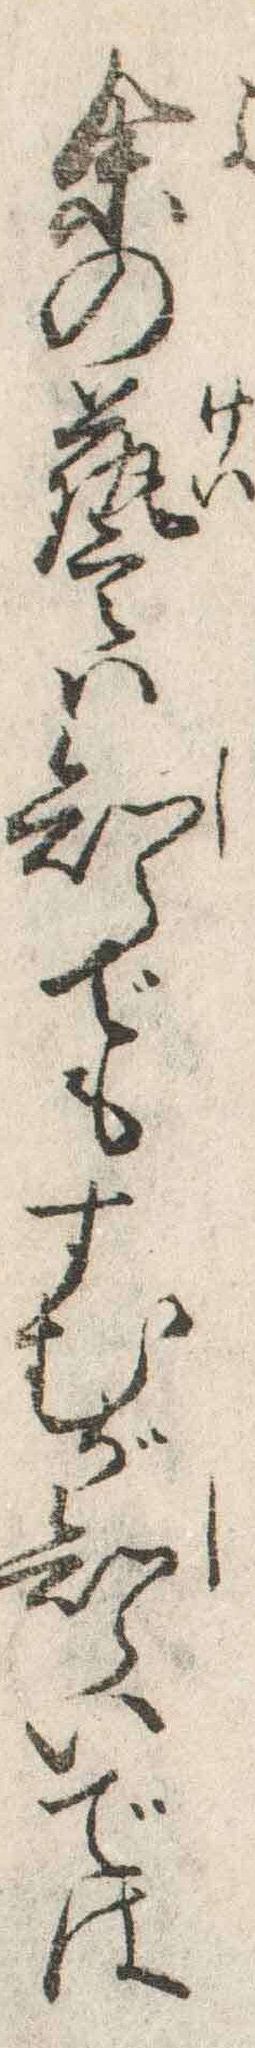余の芸は知らでもすむが知らいでは
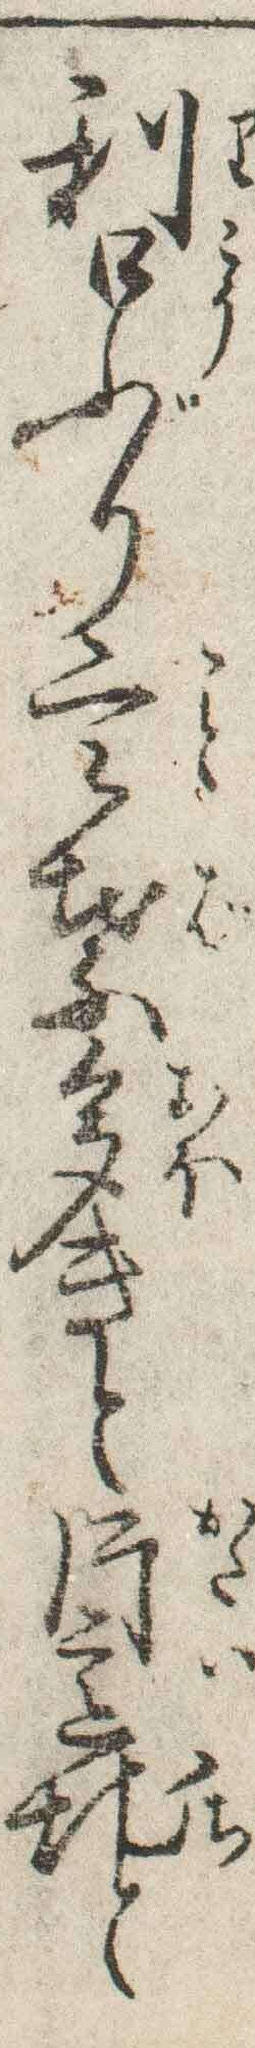利口ぶり言葉多きと片意地と
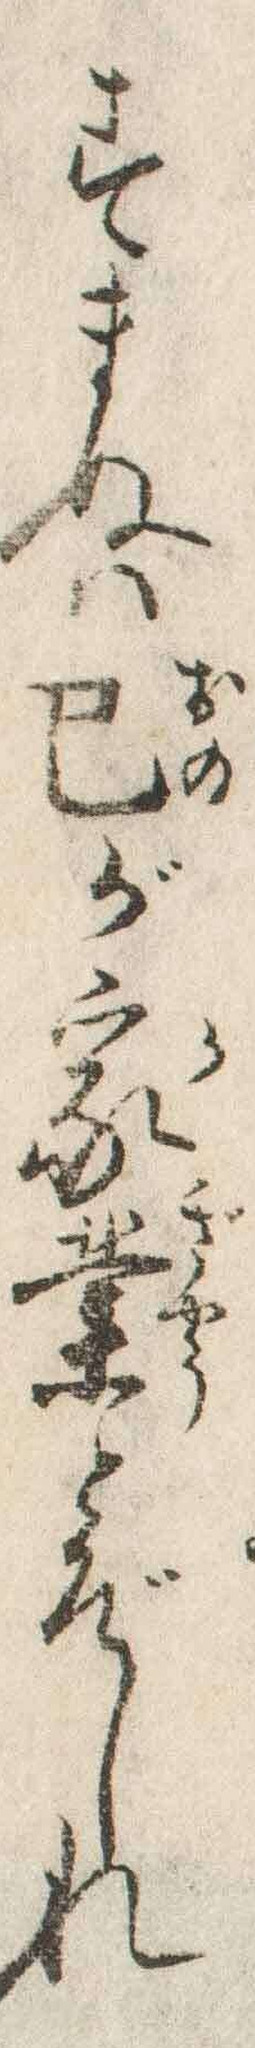すまぬ己が家業とぞしれ
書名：撫育草
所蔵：東京学芸大学附属図書館 国文学研究資料館
